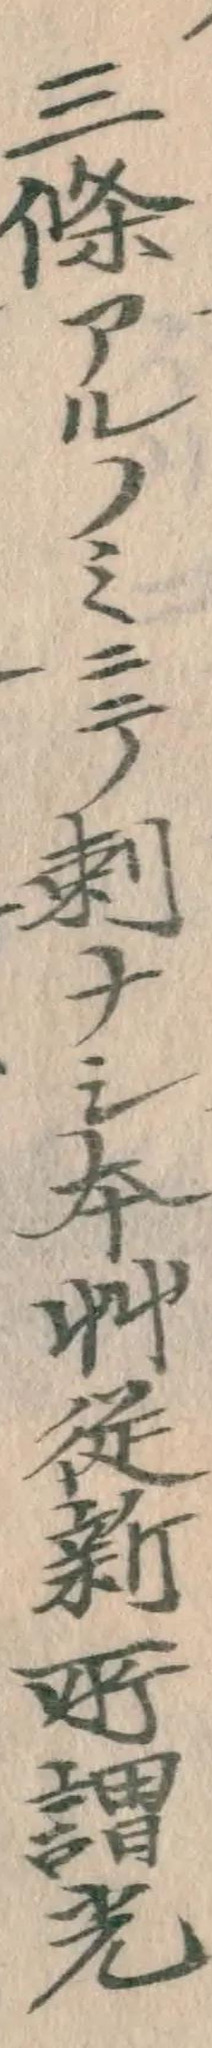三條アルノミニテ刺ナシ本草従新所謂光
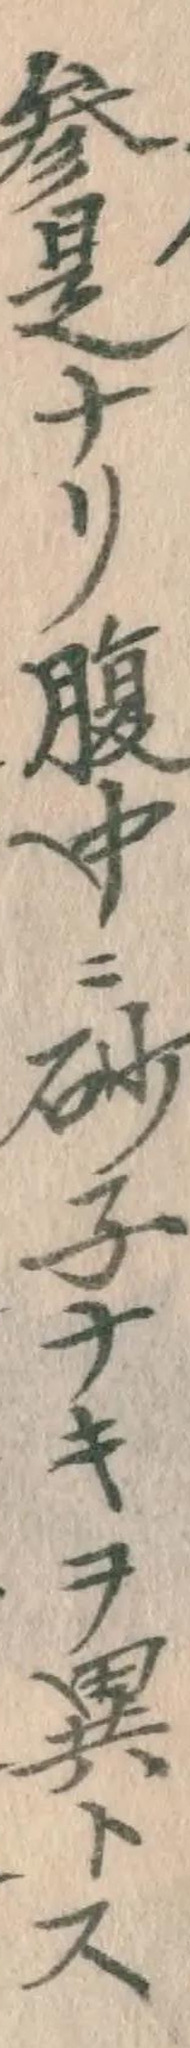参是ナリ腹中ニ砂子ナキヲ異トス
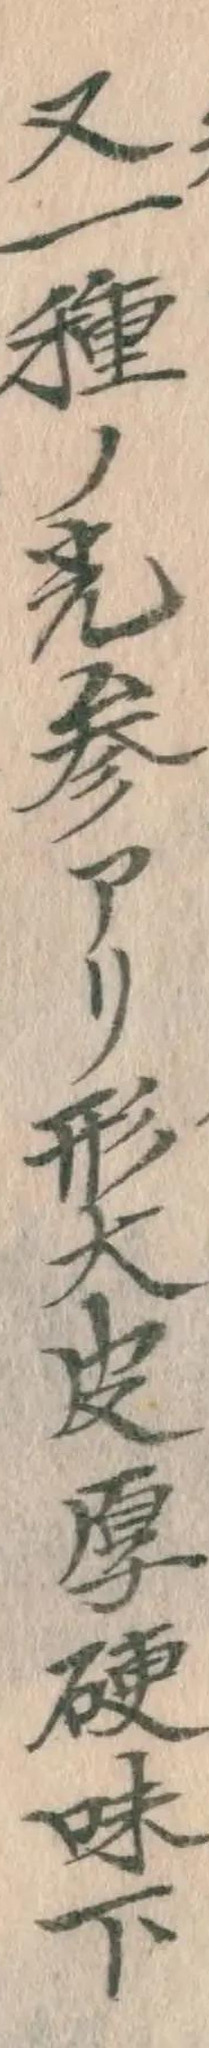又一種ノ光参アリ形大皮厚硬味下
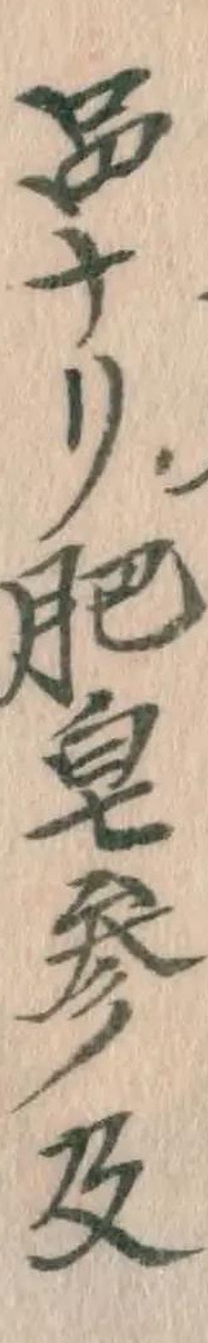品ナリ肥皂参及
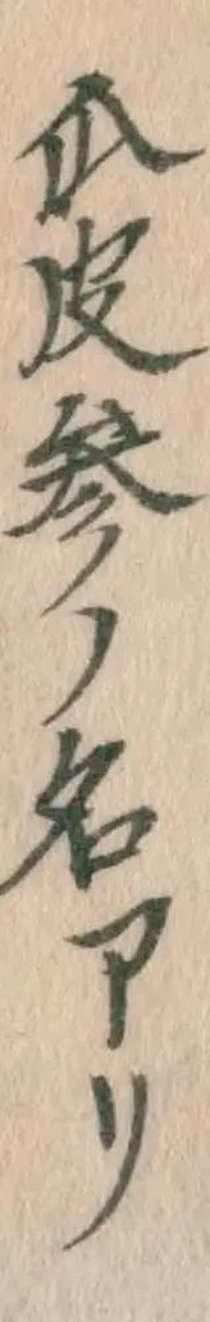瓜皮参ノ名アリ
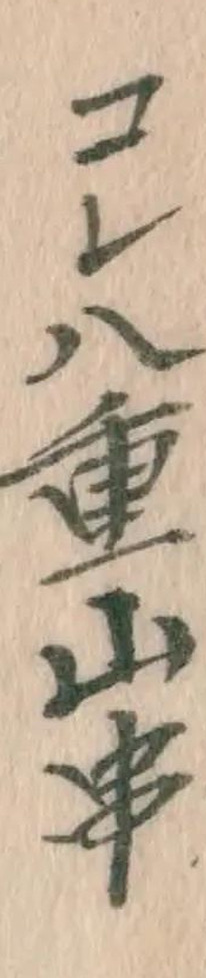コレ八重山串
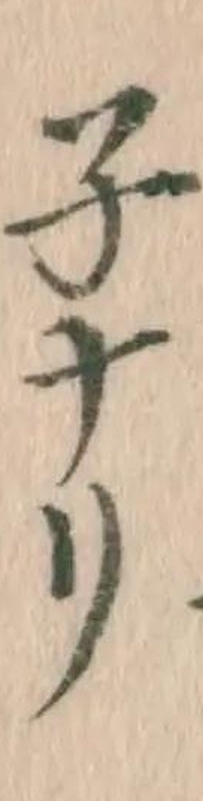子ナリ
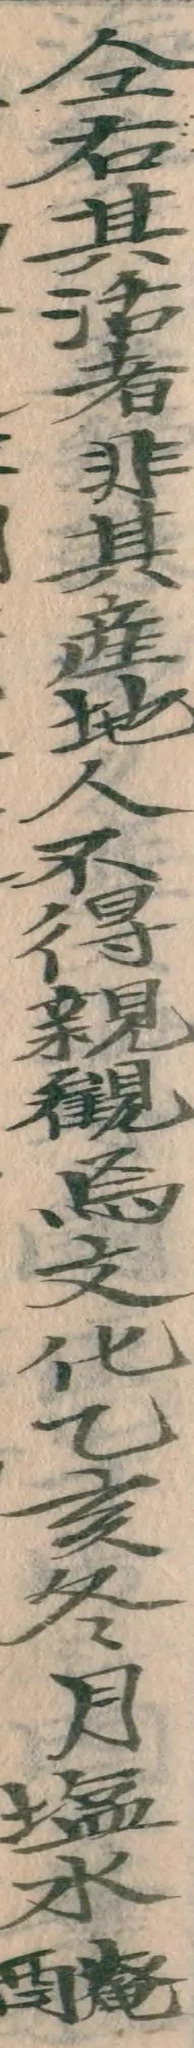仝右其活者非其産地人不得親観焉文化乙亥冬月塩水醃
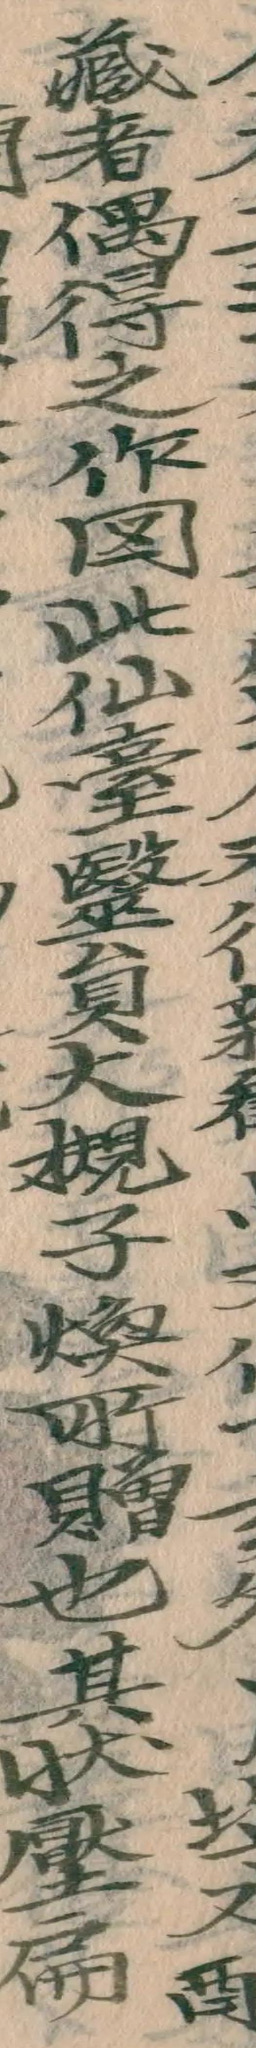藏者偶得之作図此仙台医貟大槻子煥所贈也其状壓扁
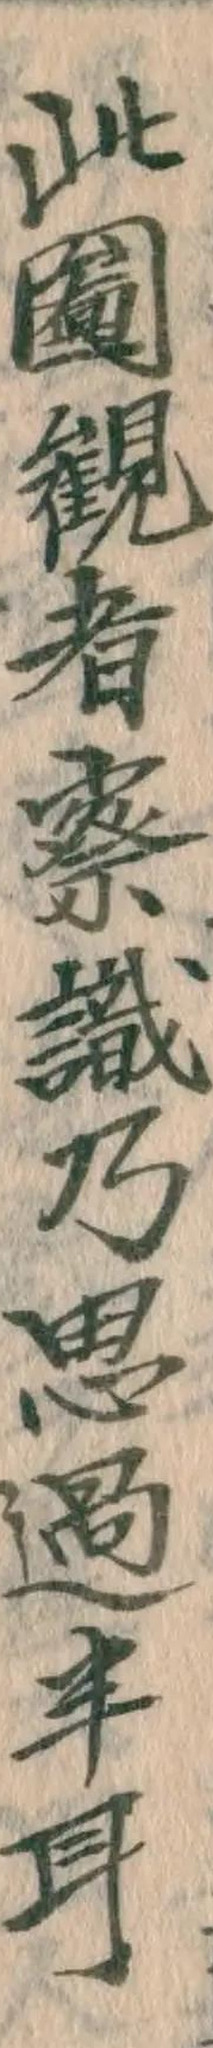此図観者察識乃思過半耳
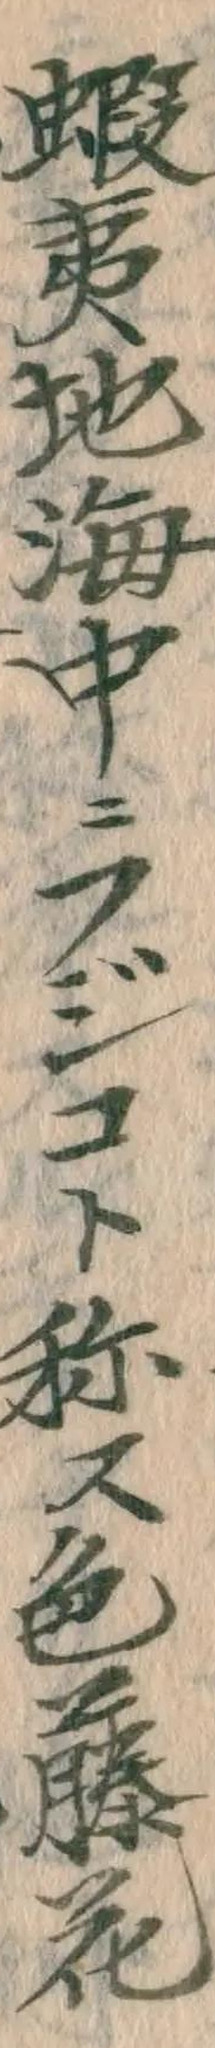蝦夷地海中ニフジコト称ス色藤花
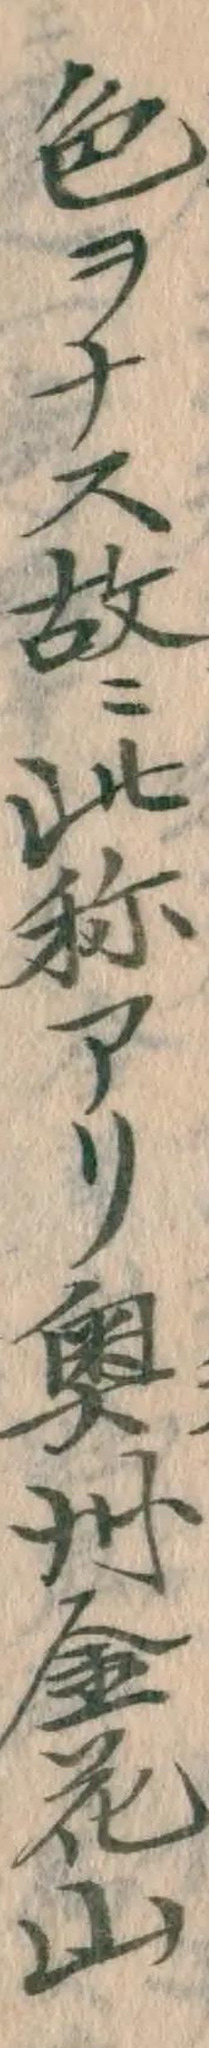色ヲナス故ニ此称アリ奥州金花山
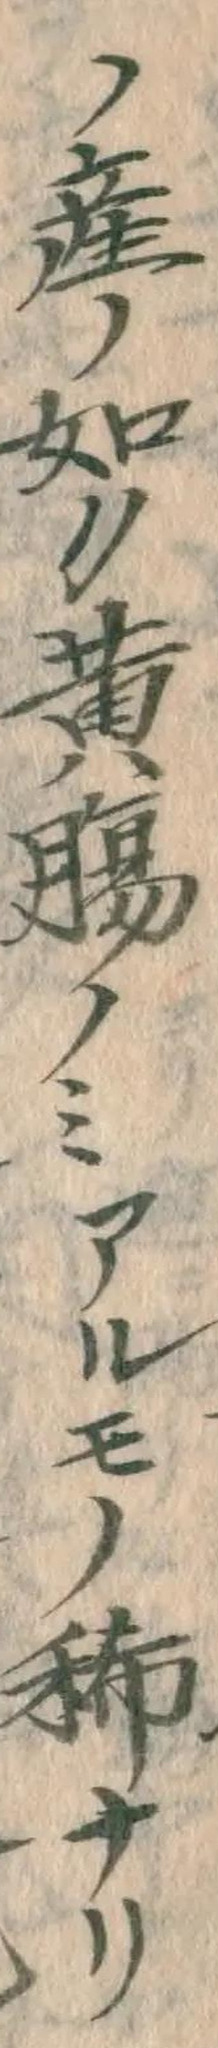ノ産ノ如ク黄腸ノミアルモノ稀ナリ
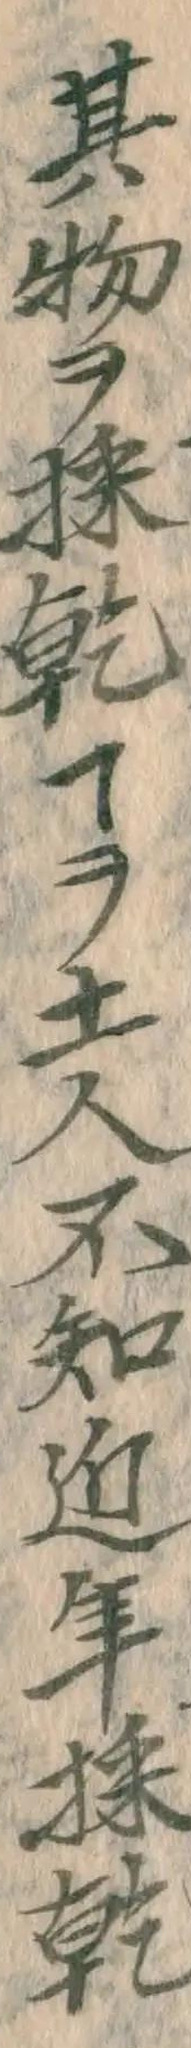其物ヲ採乾コトヲ土人不知近年採乾
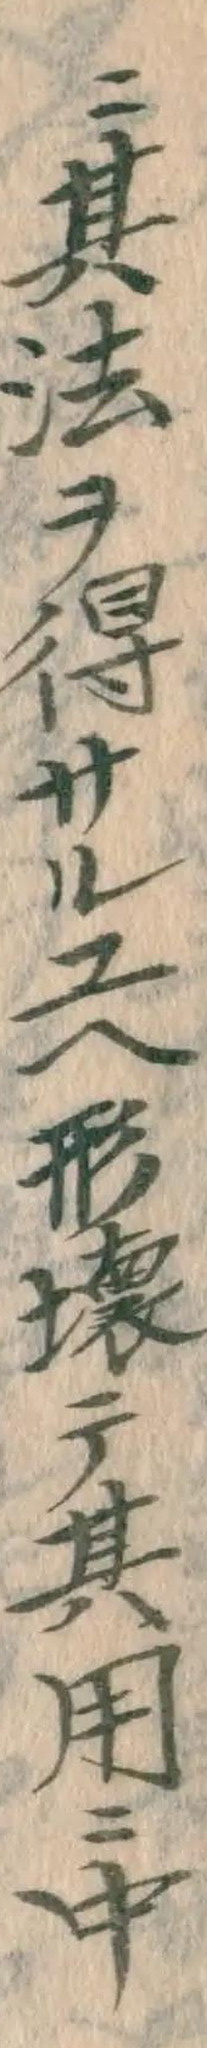ニ其法ヲ得サルユヘ形壊テ其用ニ中
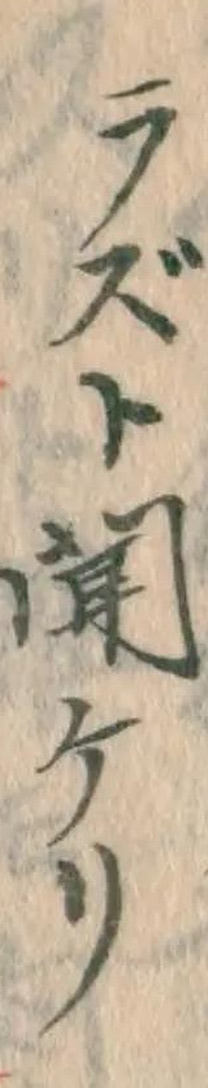ラズト聞ケリ
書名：千蟲譜 3巻. [3]
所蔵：国立国会図書館 National Diet Library, JAPAN
